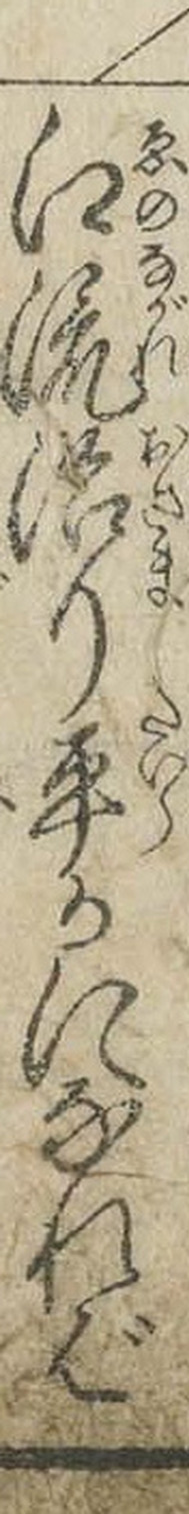江流治り平かになれば
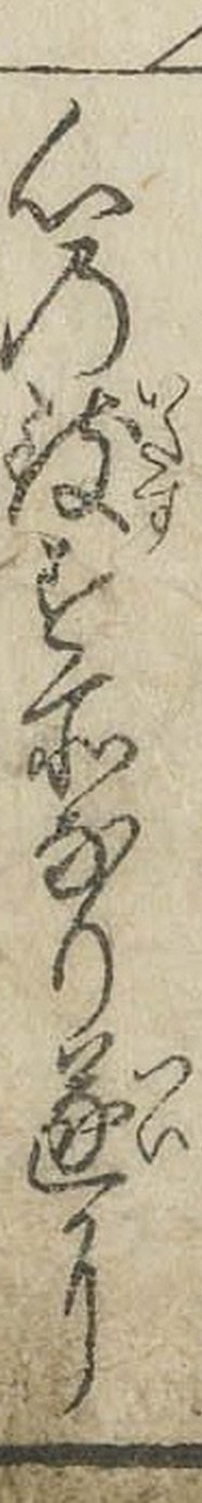心の致す所なり遂に
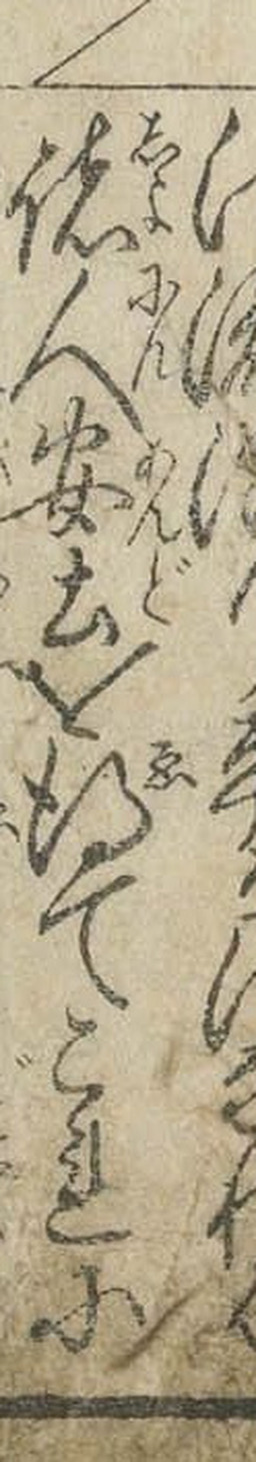諸人安土を得てこれに
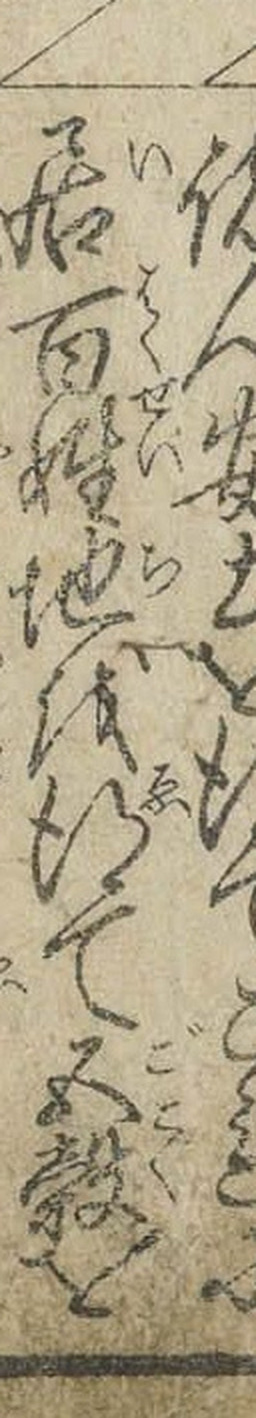居百姓地を得て五穀を
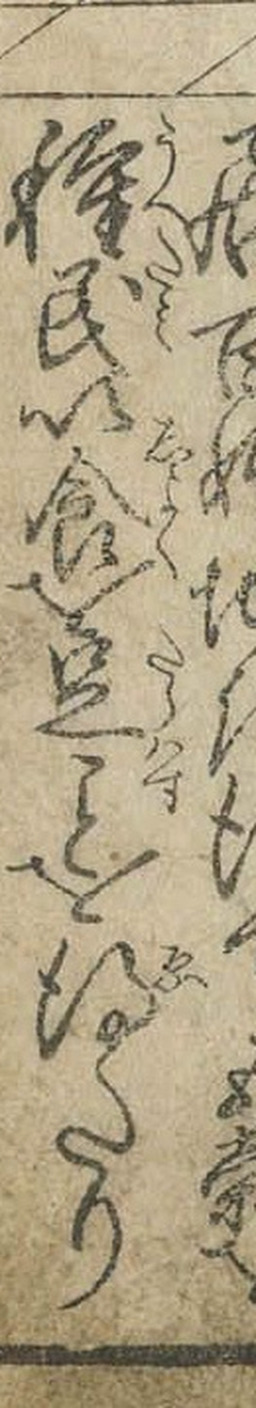種民以食を足ことを得たり

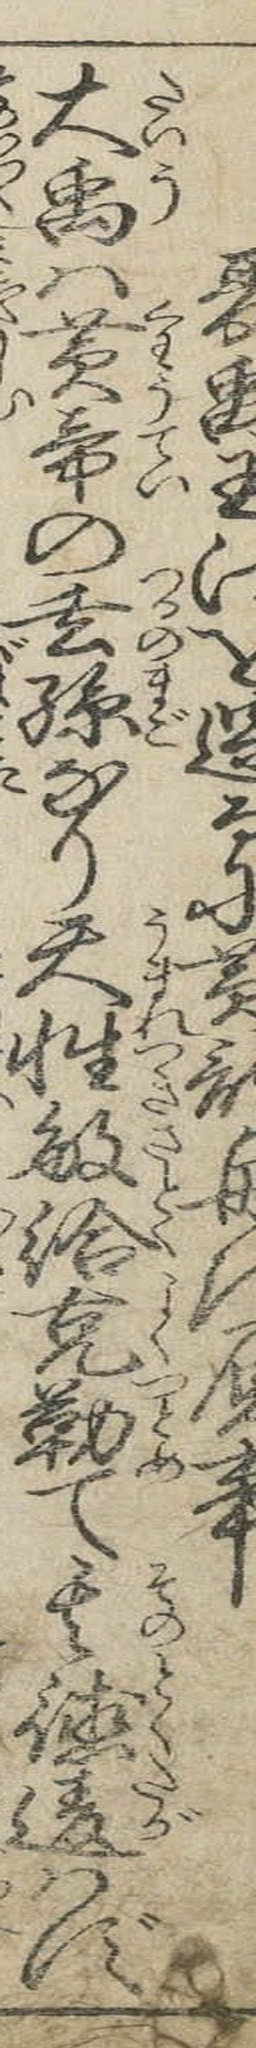大禹は黄帝の玄孫なり天性敏給克勤て其徳違はず
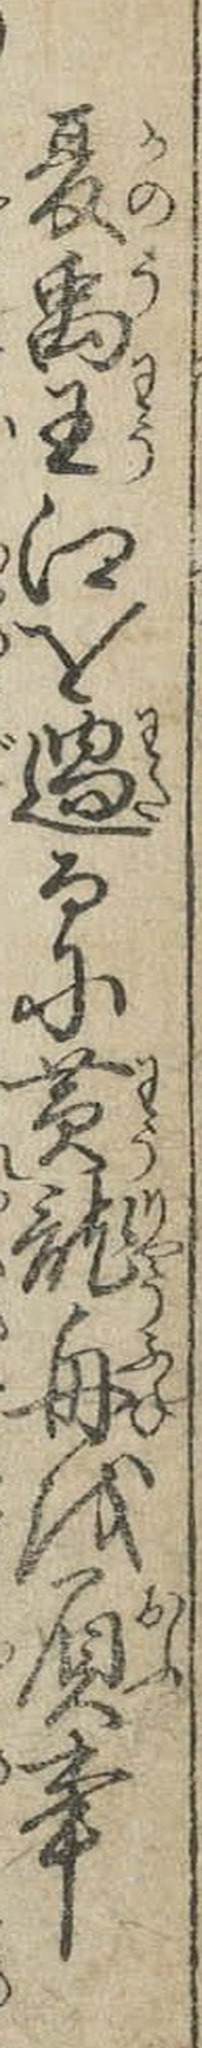夏禹王江を過るに黄竜舟を負事
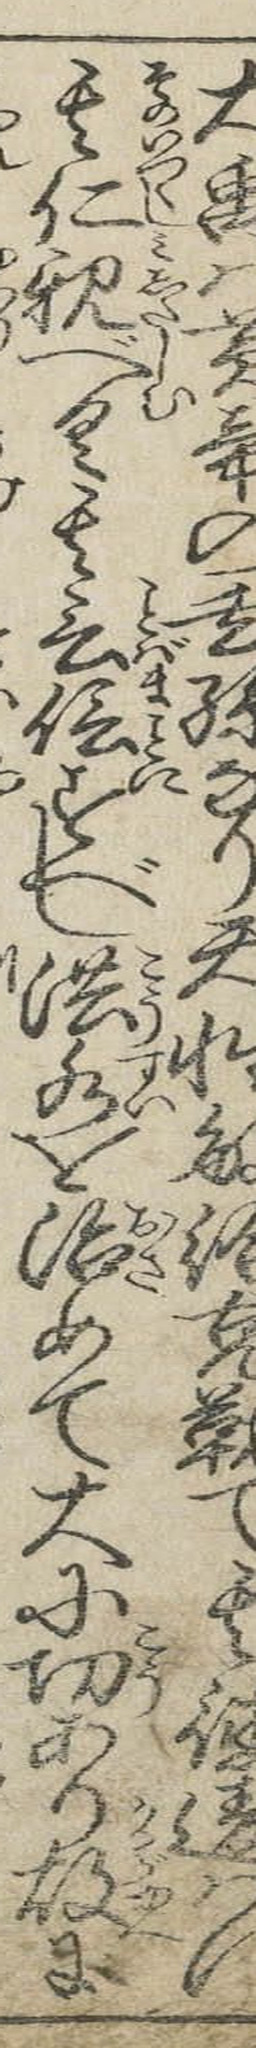其仁親べく其言信すべし洪水を治めて大に功あり故に
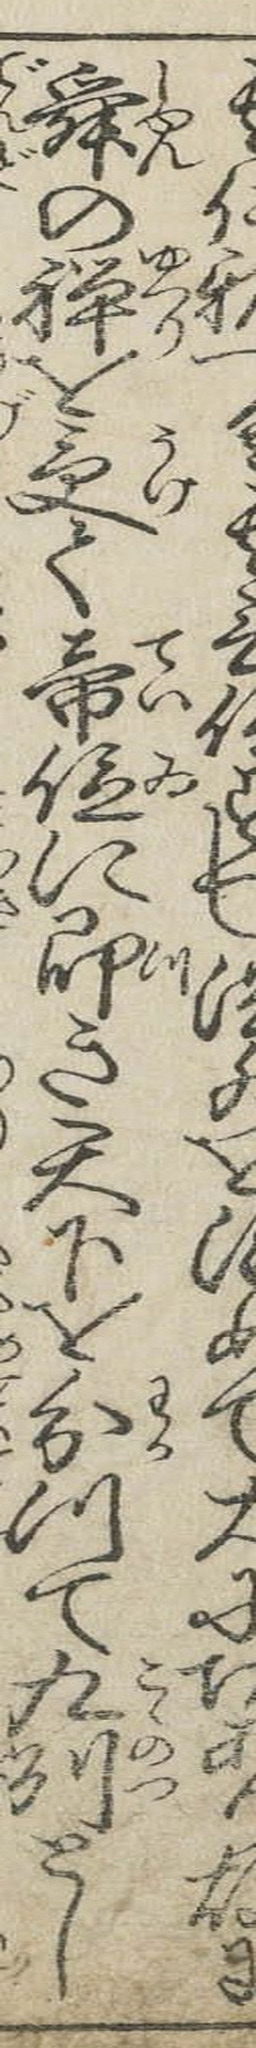舜の禅を受て帝位に即き天下を分つて九別とし
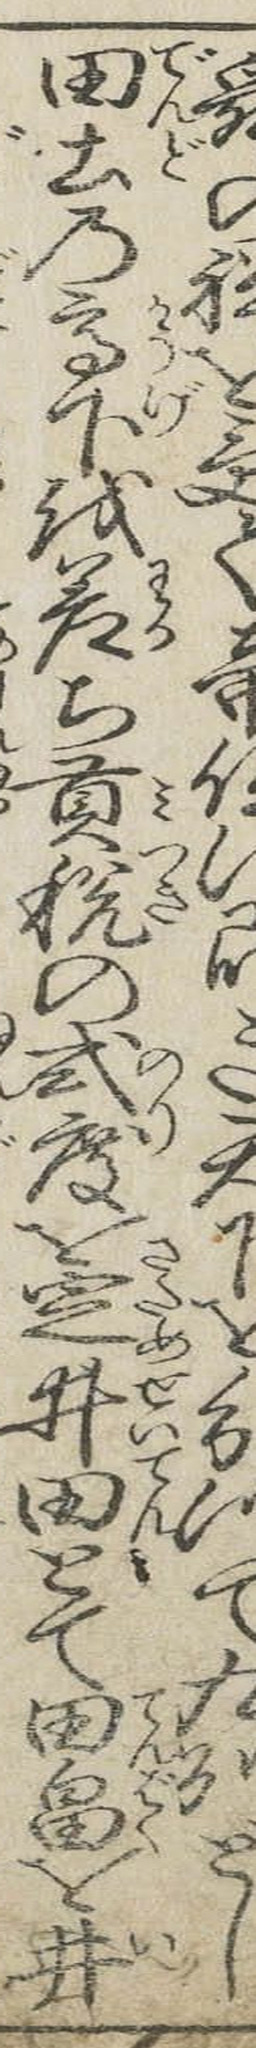田土の高下を差ち貢税の式度を定井田とて田畠を井
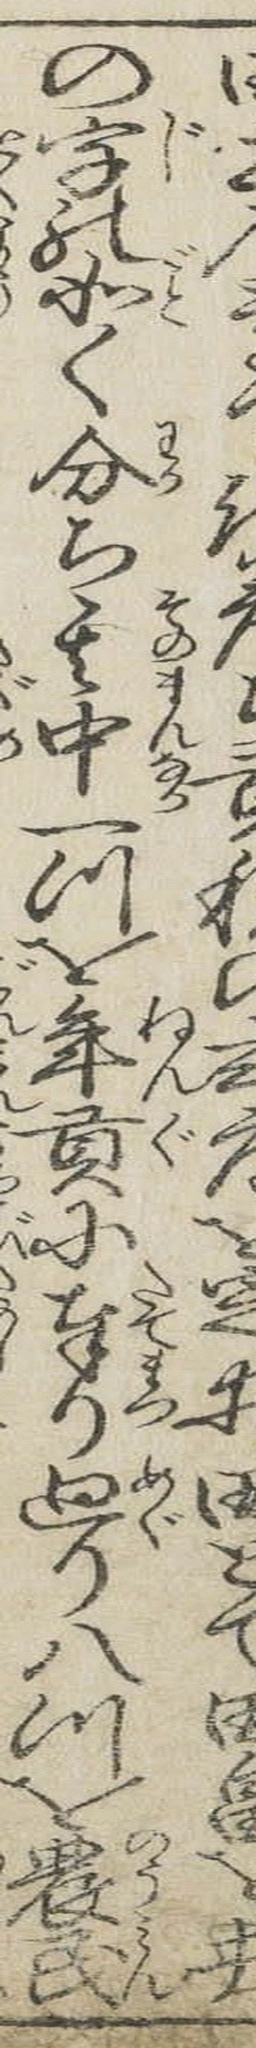の字の如く分ち其中一つを年貢に奉り廻り八つを農民
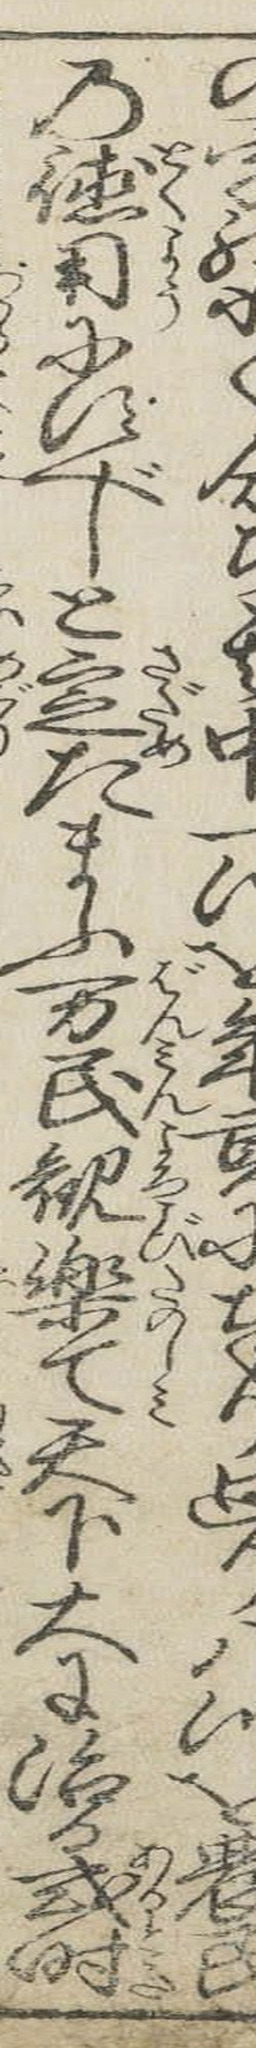の徳用にすべしと定たまふ万民観楽て天下大に治る或時
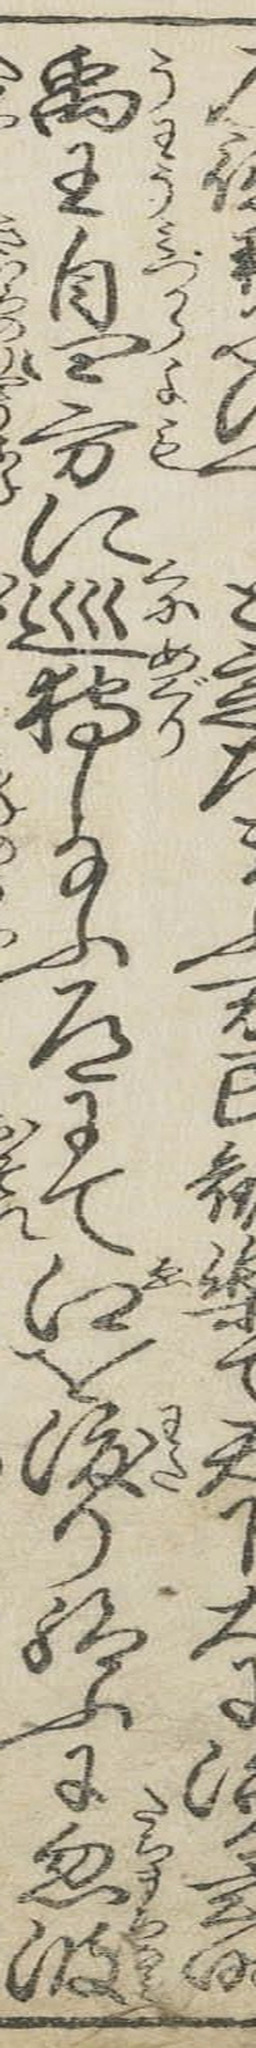禹王自四方に巡狩し給ふ道にて江を渡り給ふに忽波
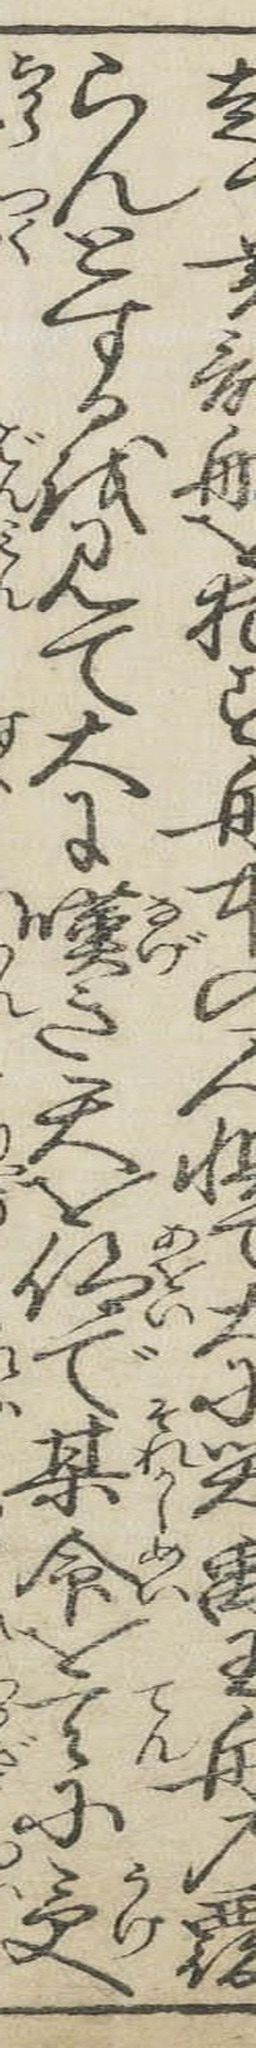らんとするを見て大に嘆き天を仰でぼ某命を天に受
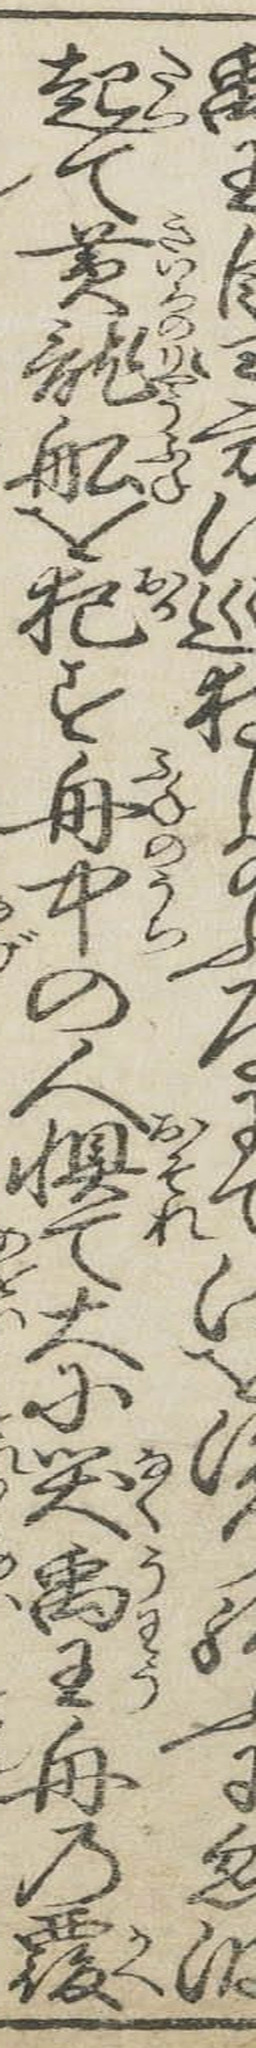起て黄竜船を犯す舟中の人惧て大に哭禹王舟の覆
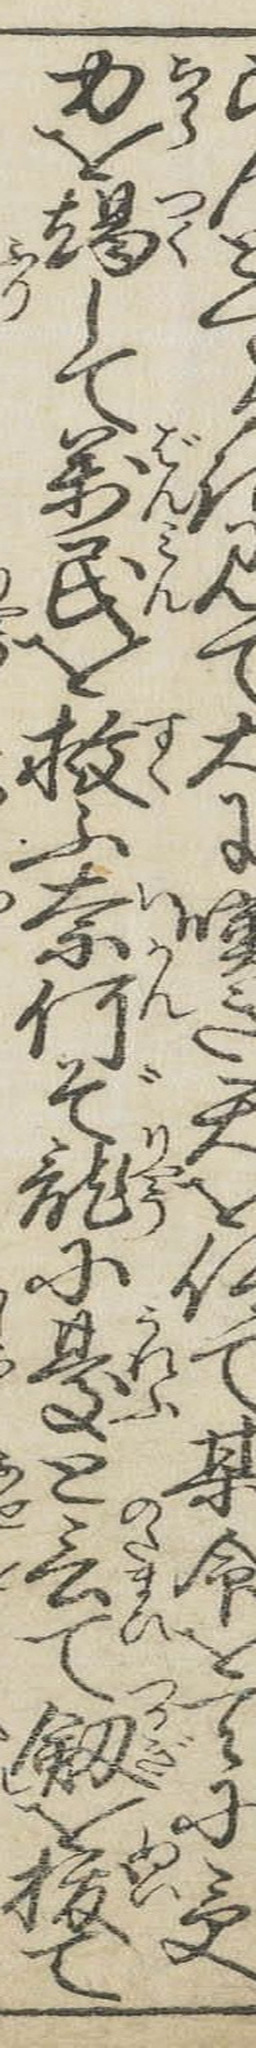力を竭して万民を救ふ奈何ぞ竜に憂と言て剣を抜て
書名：絵本写宝袋 9巻 4之巻
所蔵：東京学芸大学教育コンテンツアーカイブ
